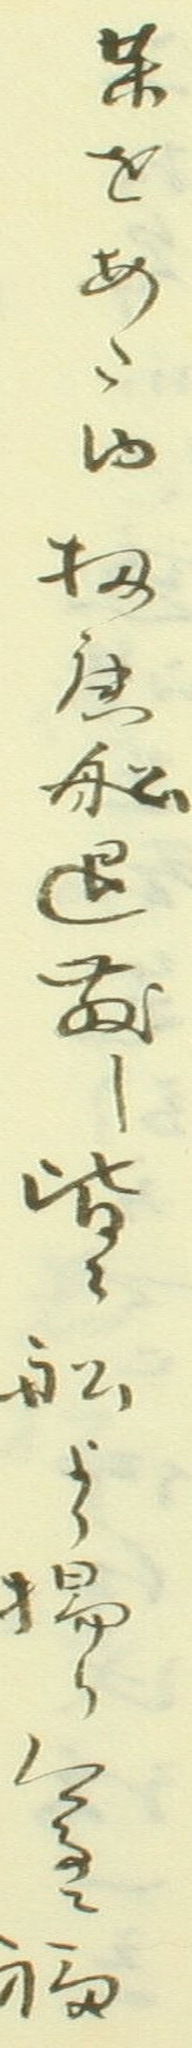薬をあたゆ扨唐船退敷し皆々船より揚りけるに福
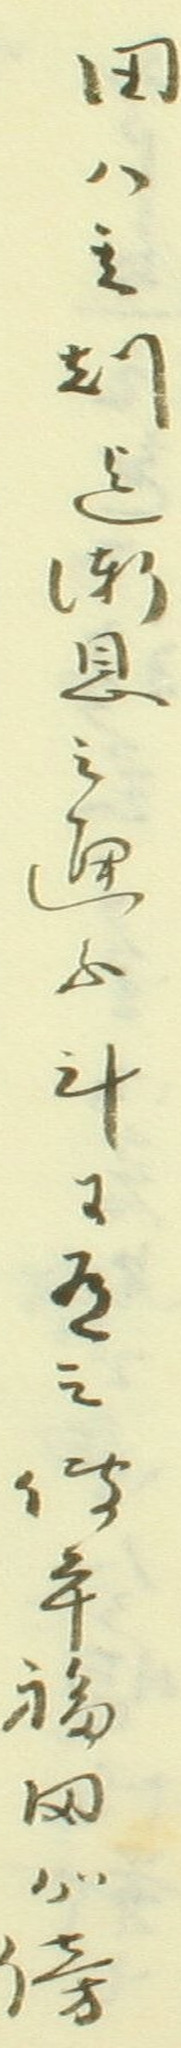田は其刻迠漸息之通不斗に有之伝平福田が傍
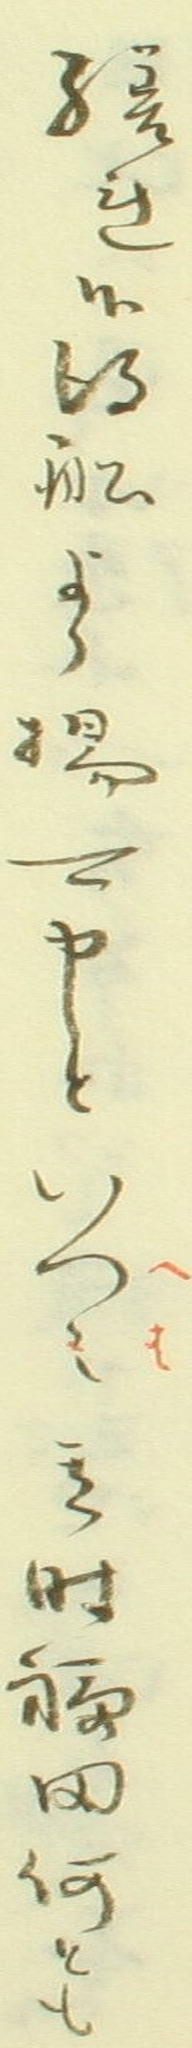？れ候得船より揚可申といつ？其時福田何とも
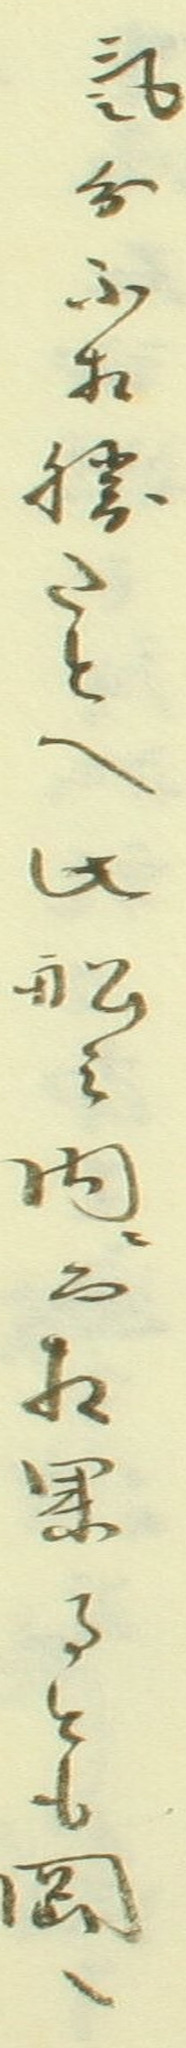分不相？たとへ此船之内に而相果るとも岡へ
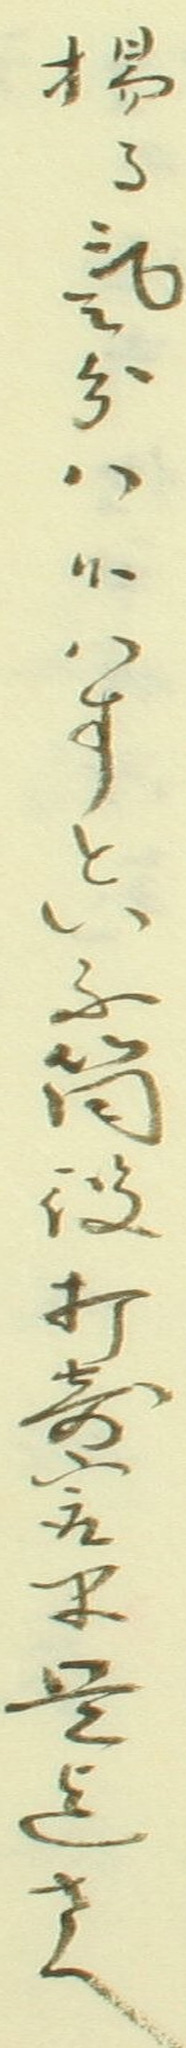揚る気分は候はすといふ筒役打寄最早是迄さへ
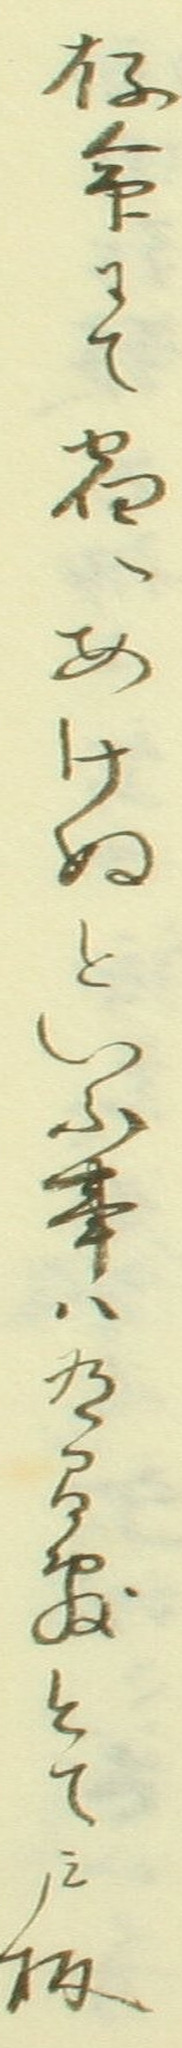存命にて宿へあけぬといふ事は有間敷とて戸板
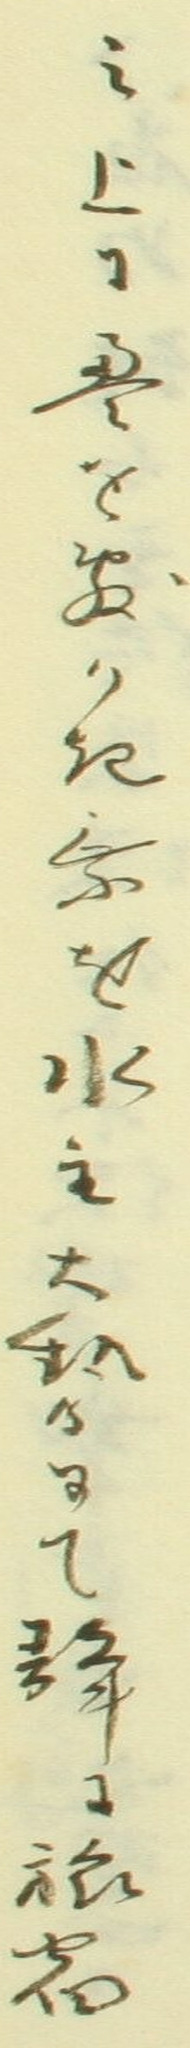之上に畳を敷り起乗を水主大勢にて？に旅宿

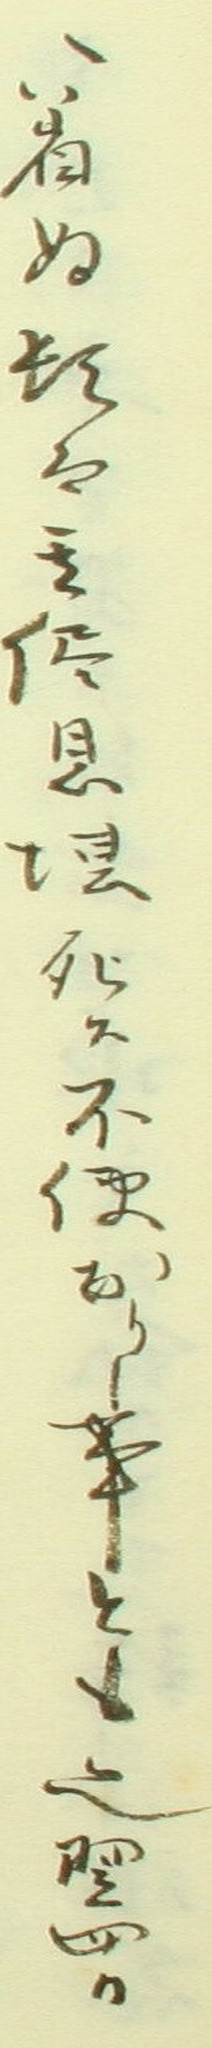へ着ぬ頼は其侭息埋死す不便なりし事とも也翌四日
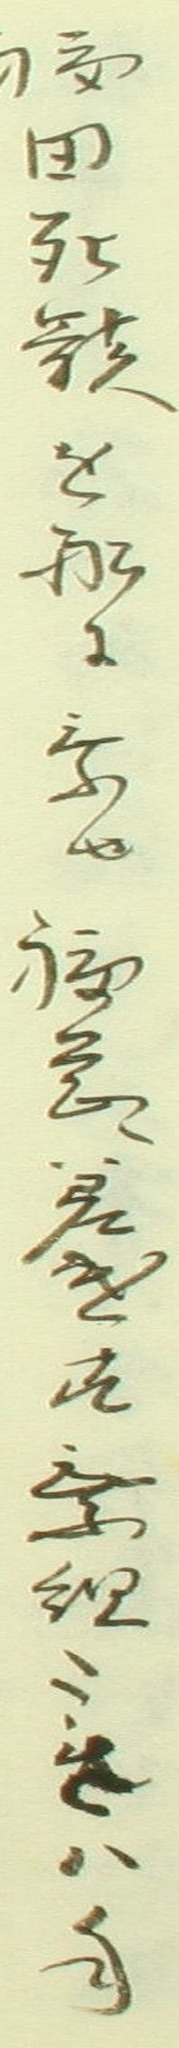福田死骸を船に乗せ福岡へ差遣す乗組たちは手
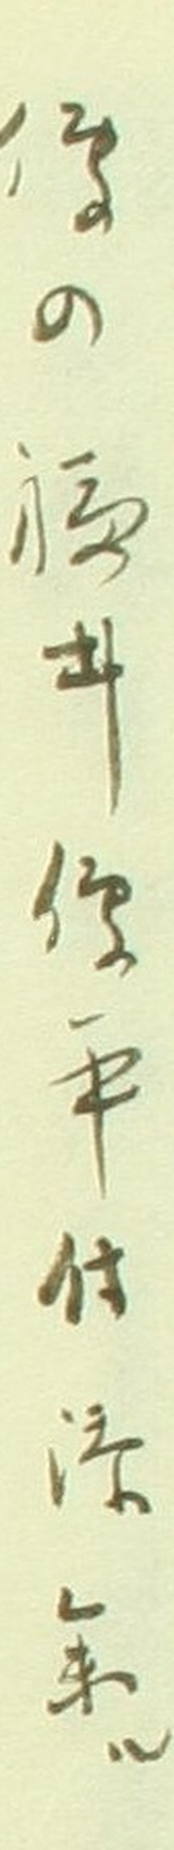伝の福井伝平付添参る
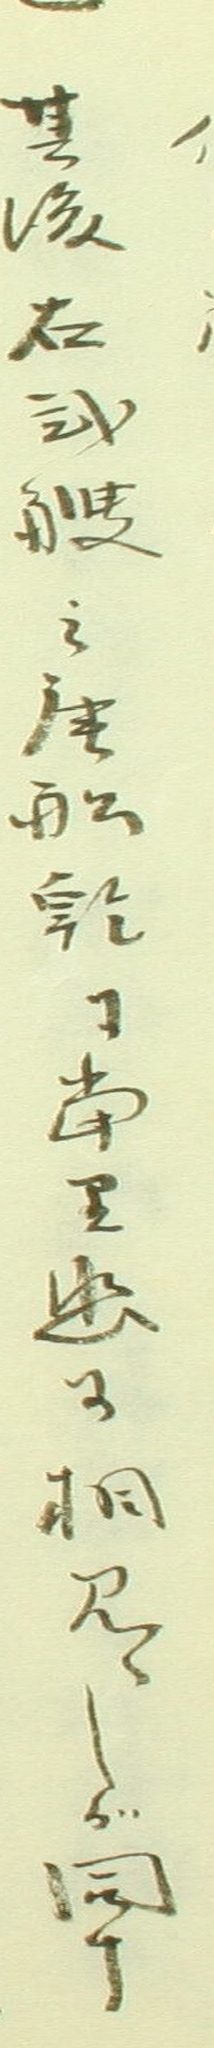一其後右弐艘之唐船乾に当里逃す相見しが同十
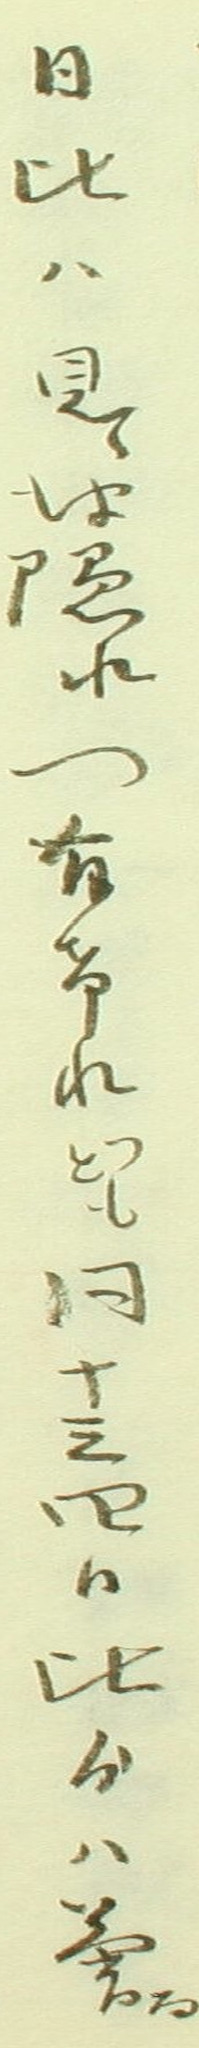日頃は見へ波隠れつ有けれども同十三四日頃ゟは蒼而
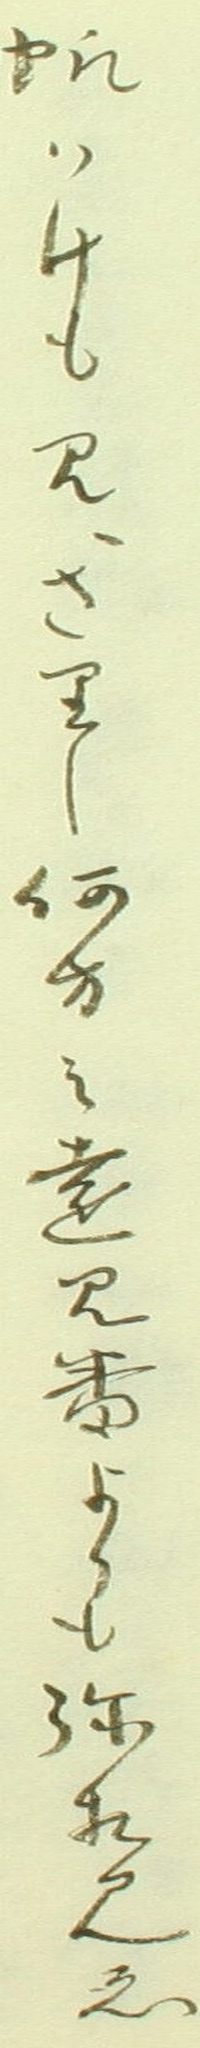帆はけも見へさりし何方の遠見番よりも弥相見ゑ
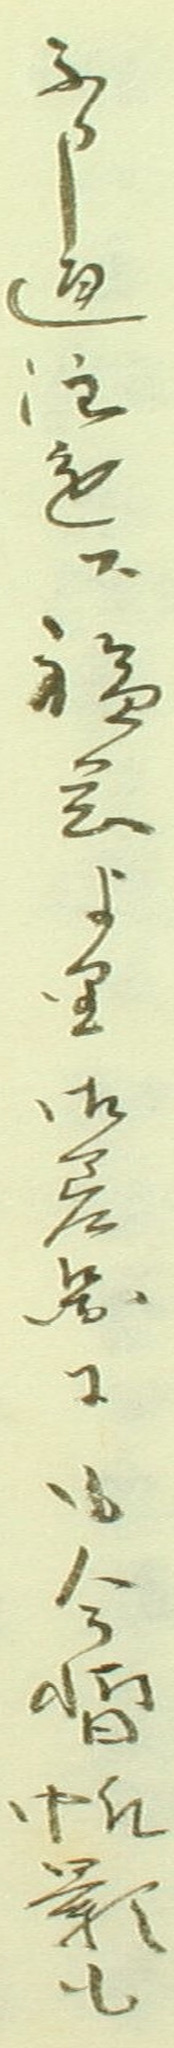不申通注進す福岡より御指図にも今暫帆影も
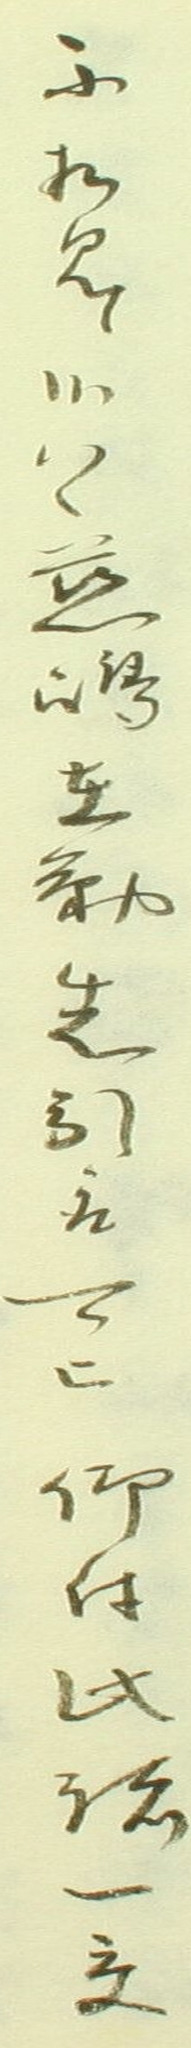不相見へ候はは慈嶋在勤先引取可被仰付此諸一交
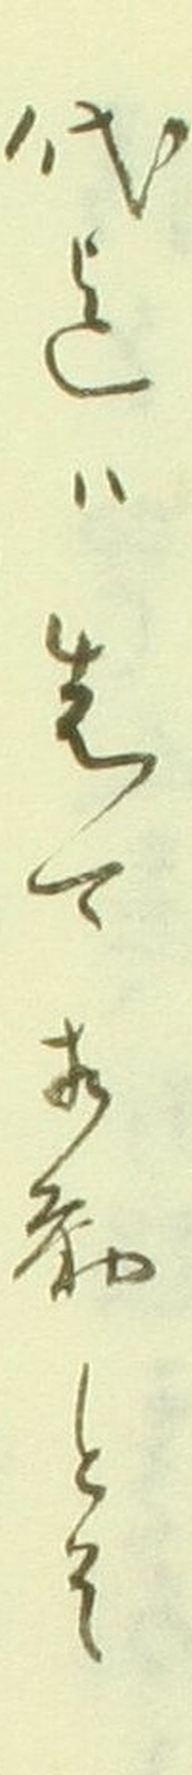代迠は先可相勤とそ
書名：唐船漂流記 三
